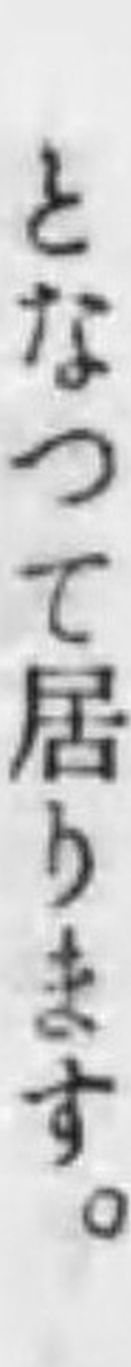となつて居ります。
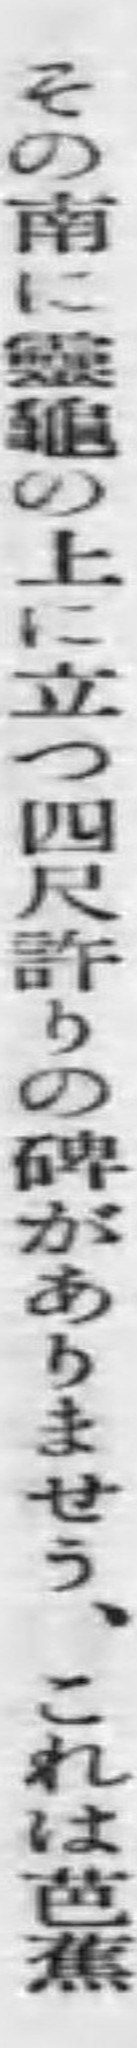その南に霊亀の上に立つ四尺許りの碑がありませう、これは芭蕉
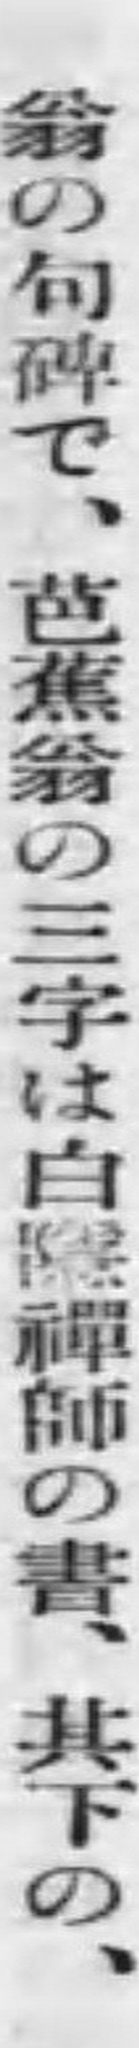翁の句碑で、芭蕉翁の三字は白隠禅師の書、其下の、
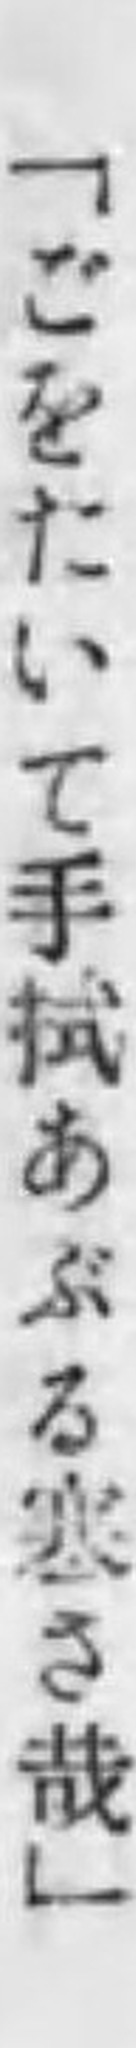「ごをたいて手拭あぶる寒さ哉」
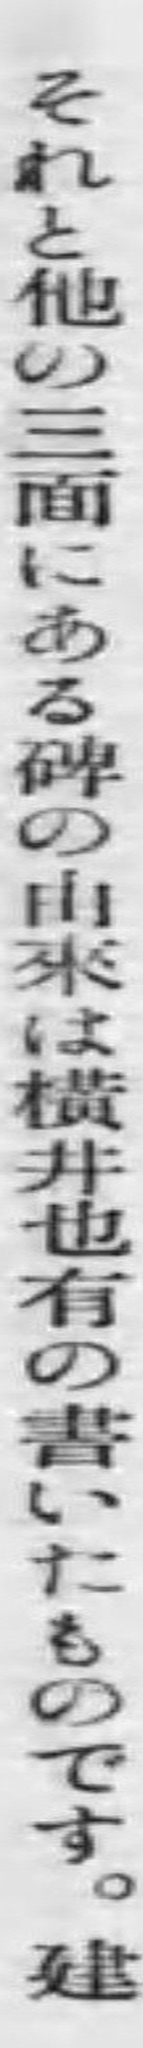それと他の三面にある碑の由来は横井也有の書いたものです。建
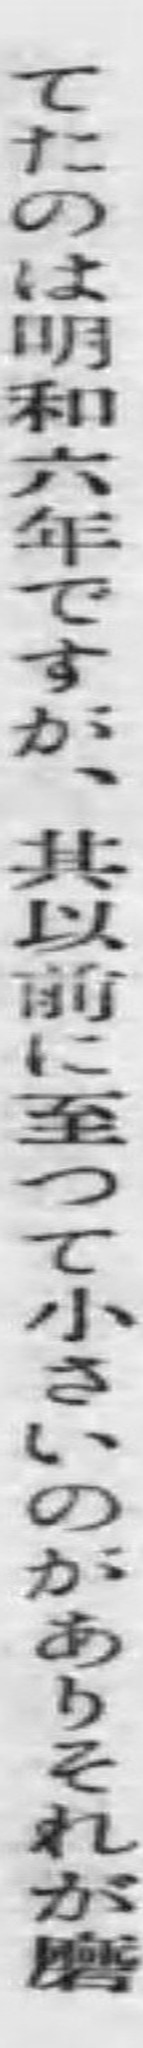てたのは明和六年ですが、其以前に至つて小さいのがありそれが磨
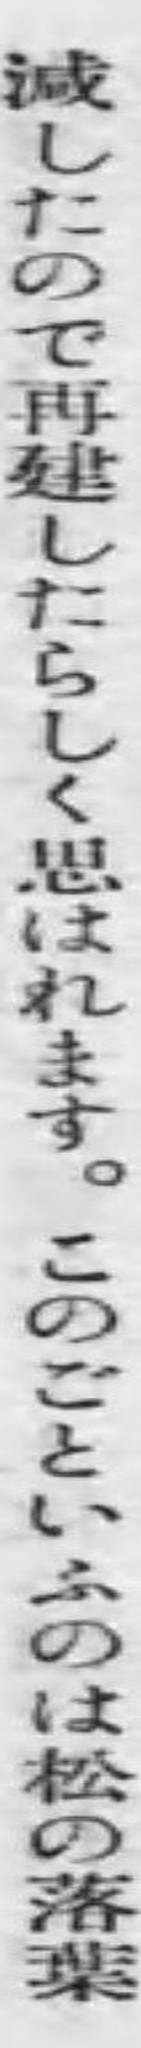滅したので再建したらしく思はれます。このごといふのは松の落葉
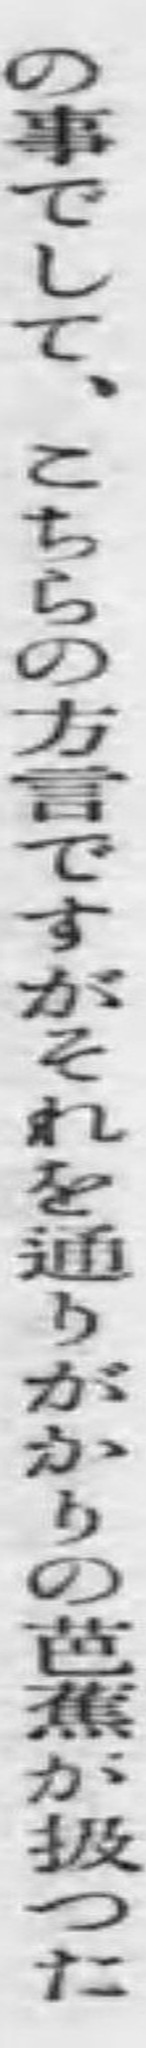の事でして、こちらの方言ですがそれを通りがかりの芭蕉が扱つた
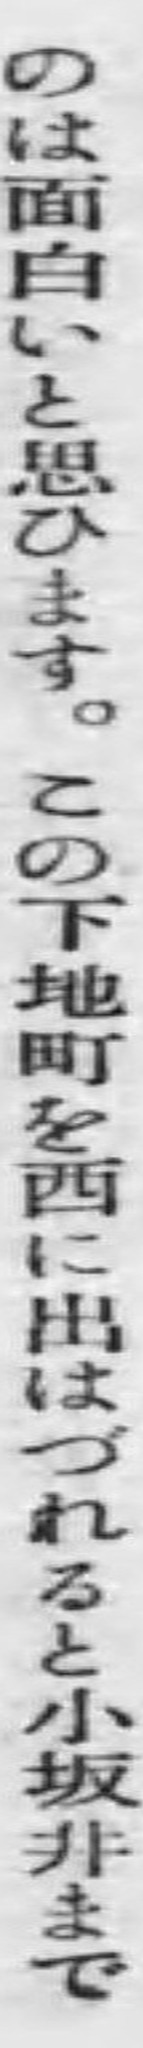のは面白いと思ひます。この下地町を西に出はづれると小坂井まで
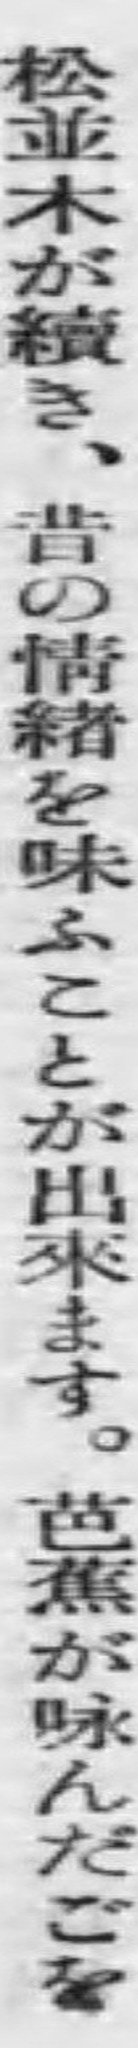松並木が続き、昔の情緒を味ふことが出来ます。芭蕉が咏んだごを
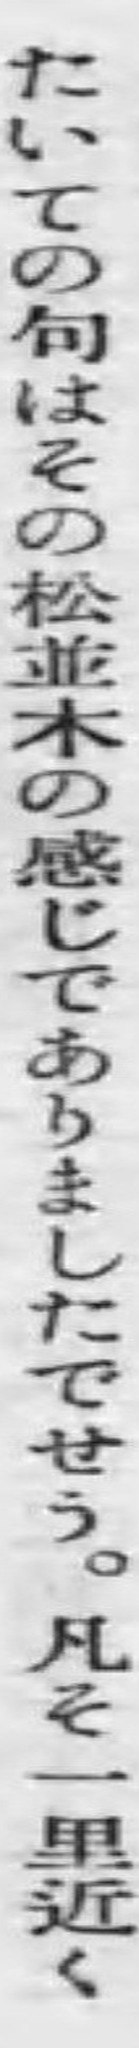たいての句はその松並木の感じでありましたでせう。凡そ一里近く
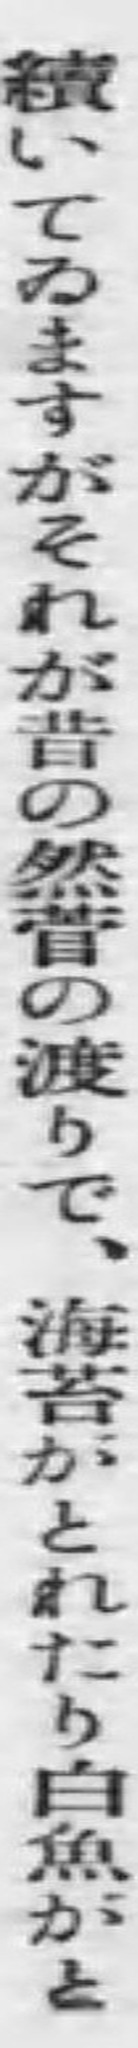続いてゐますがそれが昔の然菅の渡りで、海苔がとれたり白魚がと
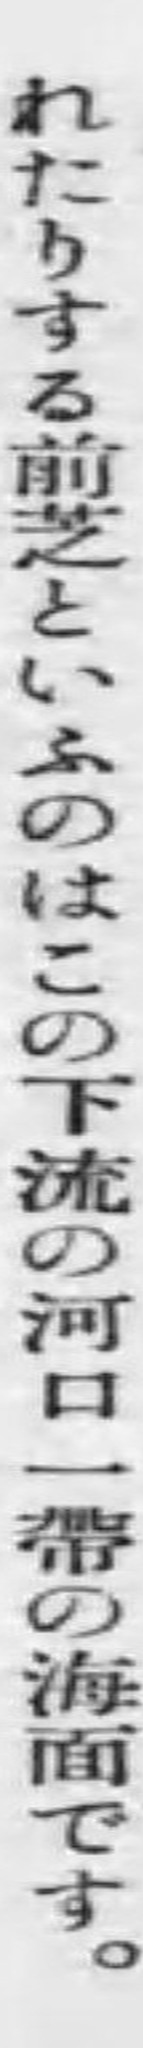れたりする前芝といふのはこの下流の河口一帯の海面です。
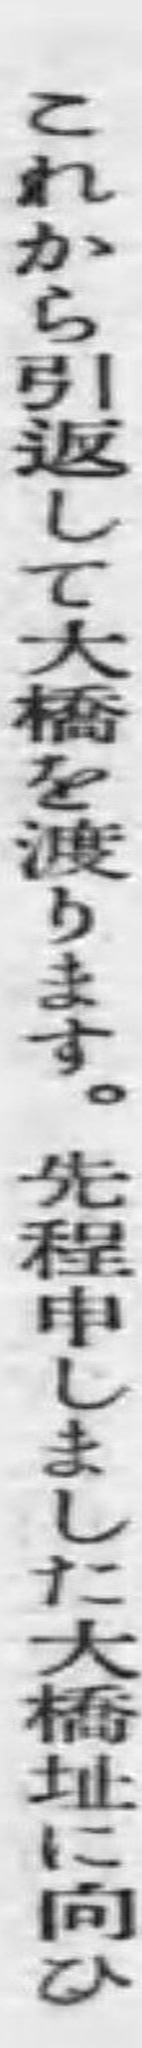これから引返して大橋を渡ります。先程申しました大橋址に向ひ
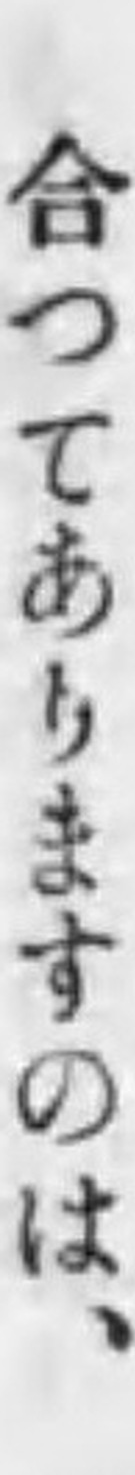合つてありますのは、
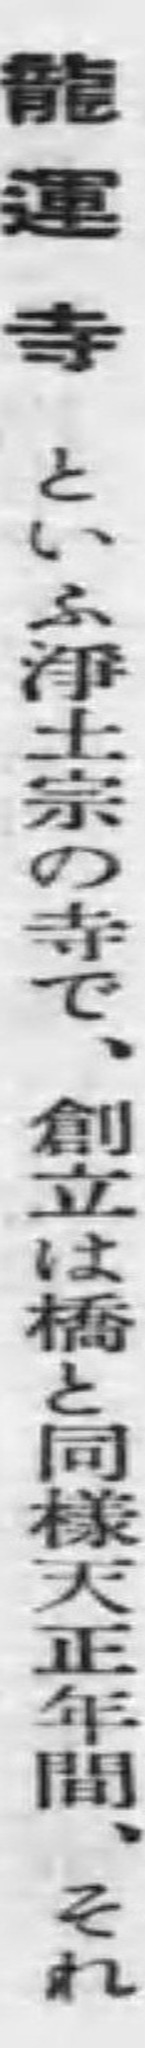龍運寺といふ浄土宗の寺で、創立は橋と同様天正年間、それ
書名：東三河道中記 : 豊橋市及其附近案内
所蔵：国立国会図書館 National Diet Library, JAPAN
